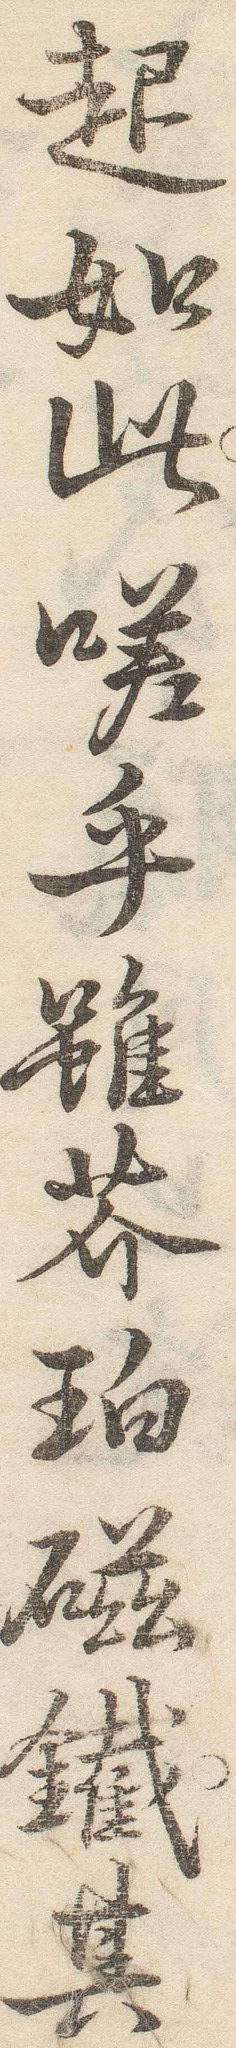起如此嗟乎雖芥珀磁鉄其
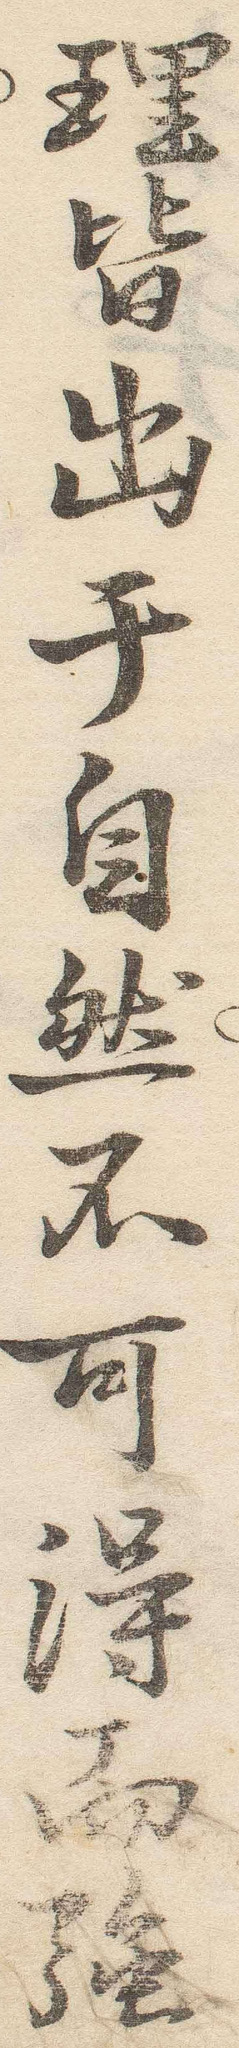理皆出于自然不可得而強
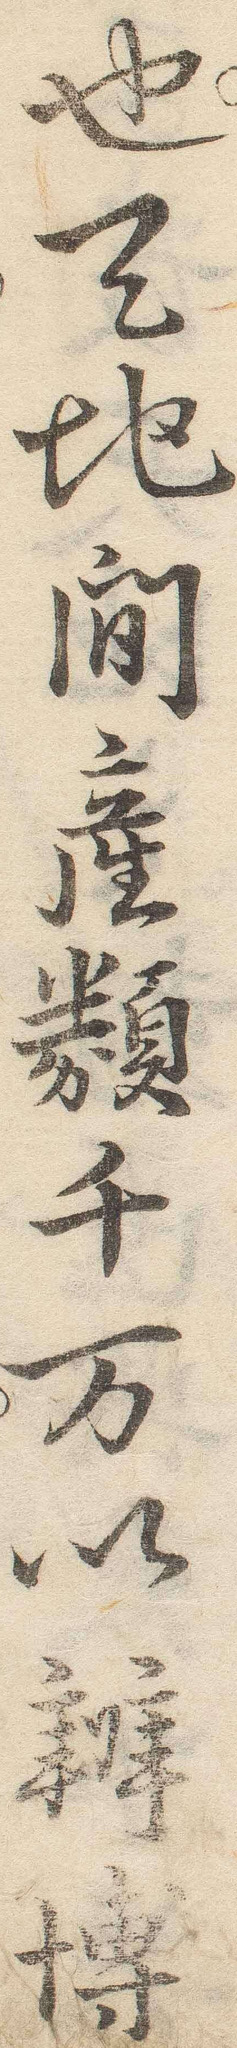也天地間産類千万以弁博
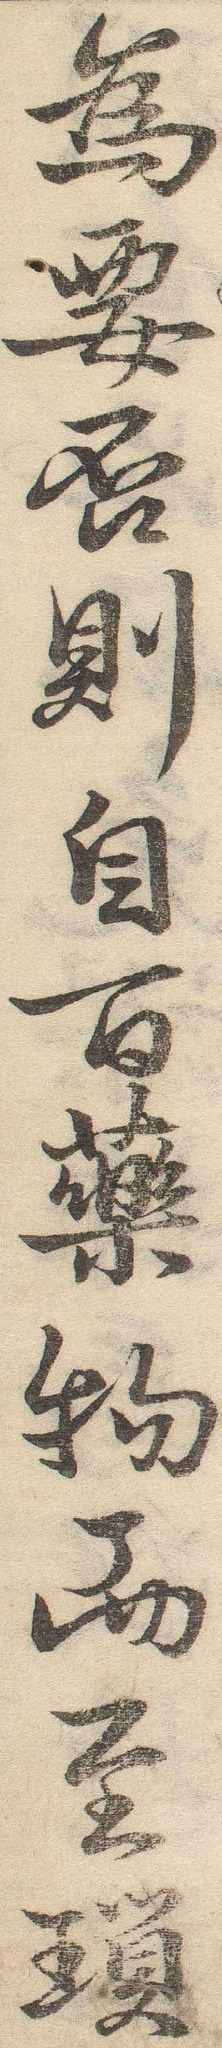為要否則自百薬物而至瑣

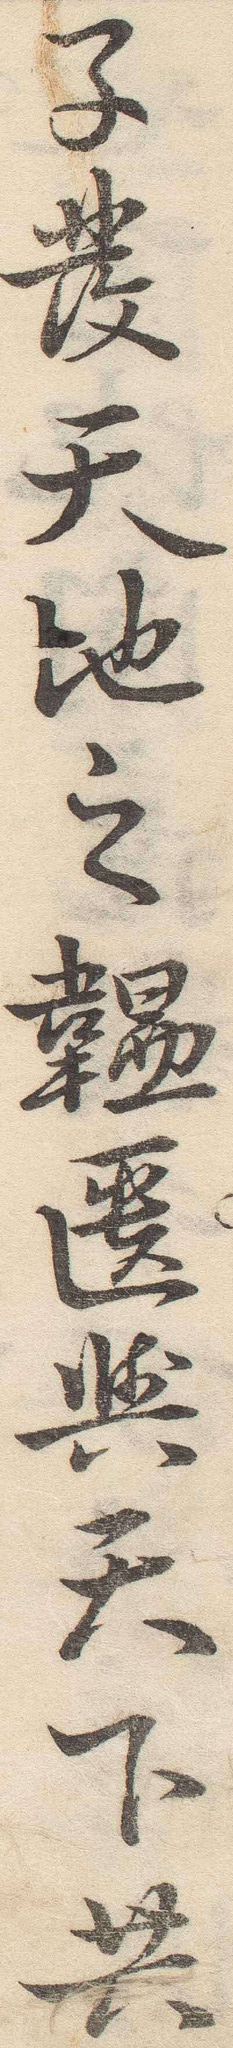子発天地之韞匱与天下共
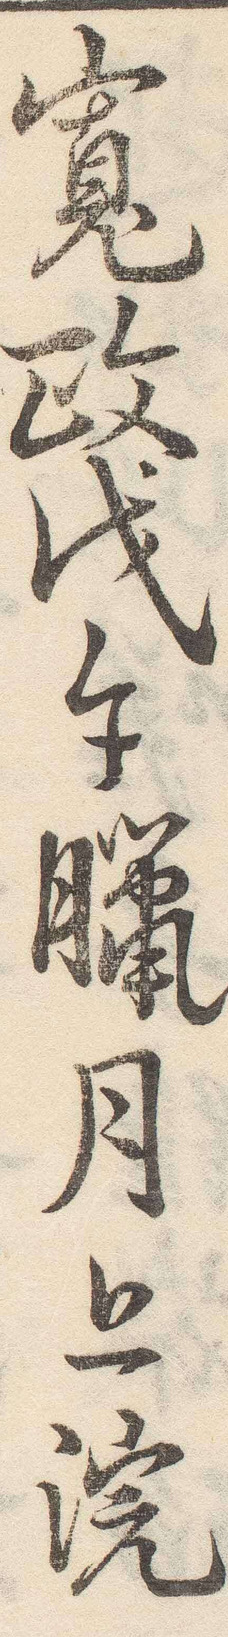寛政戊午臘月上浣
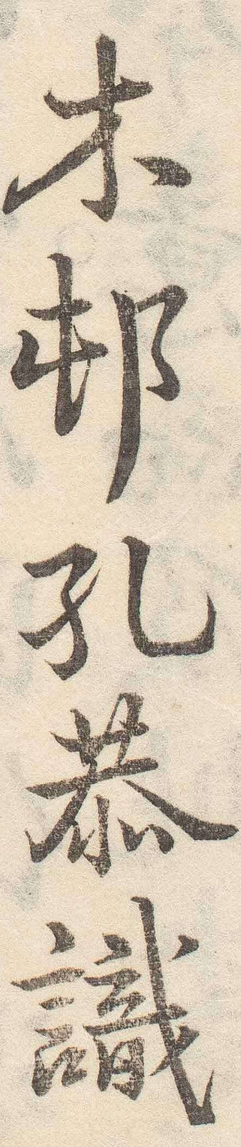木邨孔恭識
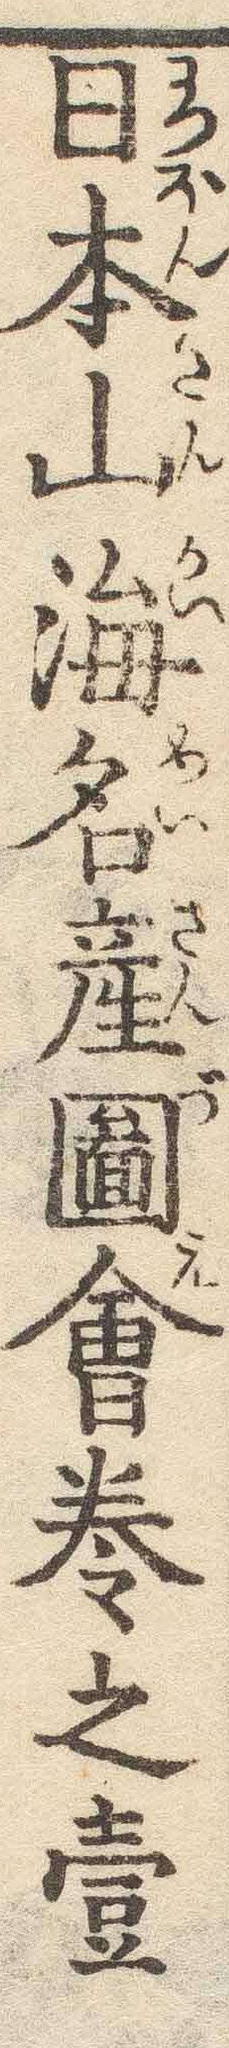日本山海名産図会巻之壱
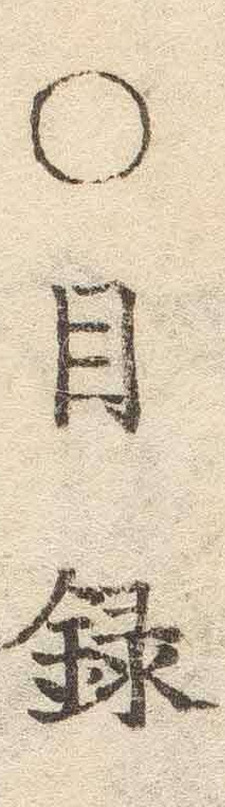○目録
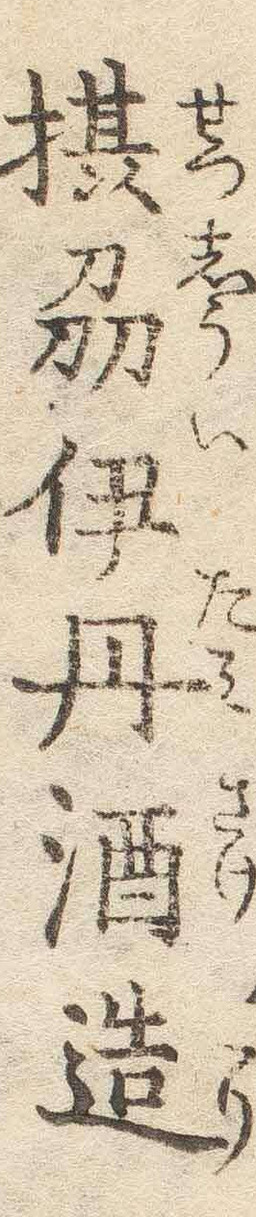摂州伊丹酒造

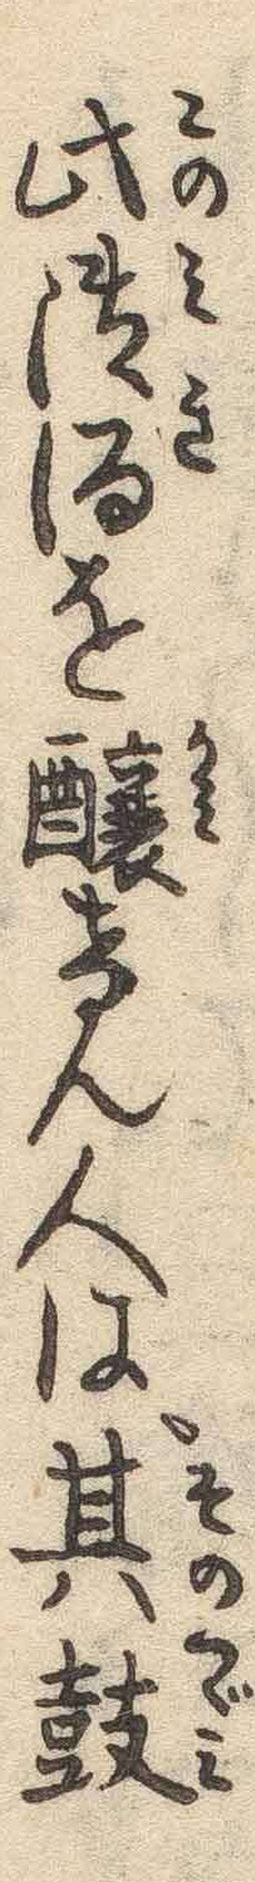此御酒を醸けん人は。其鼓
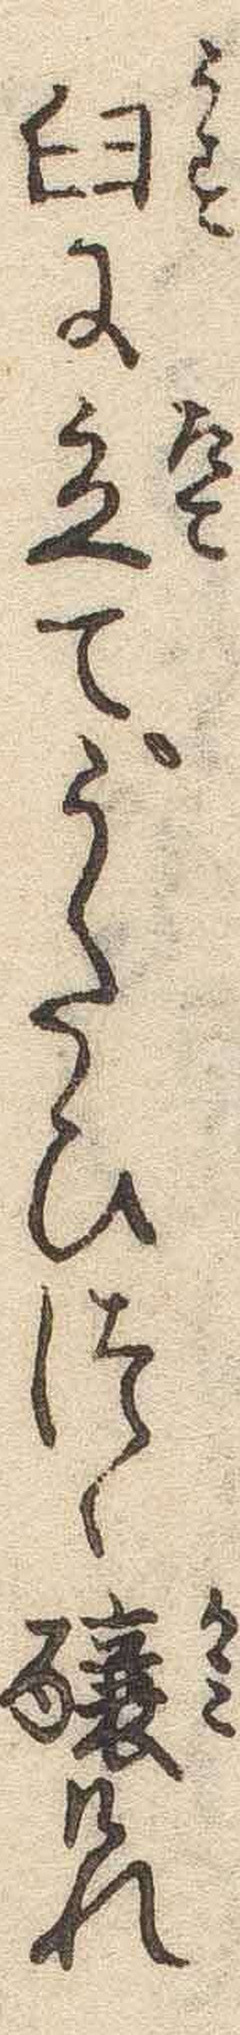臼に立て。うたひつゝ醸けれ
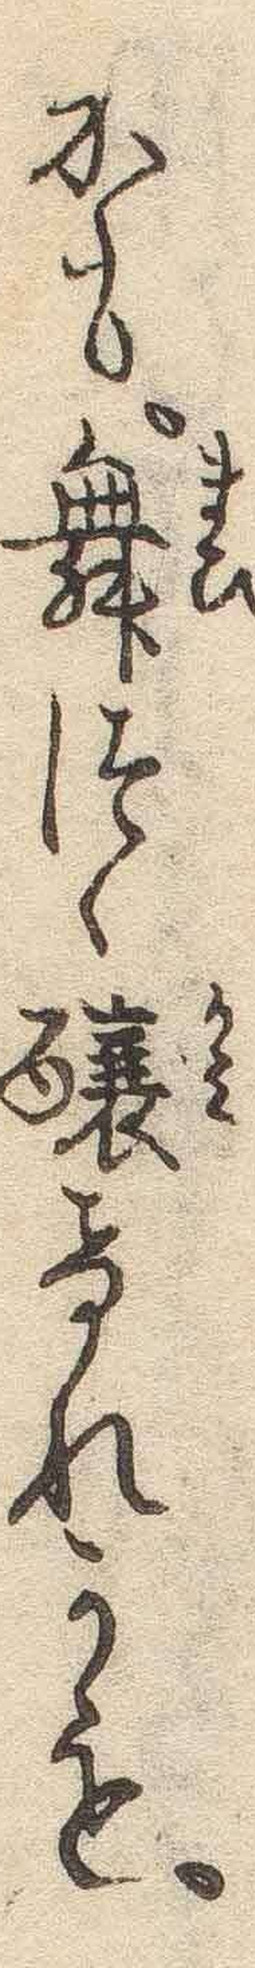かも。舞つゝ醸けれかも。
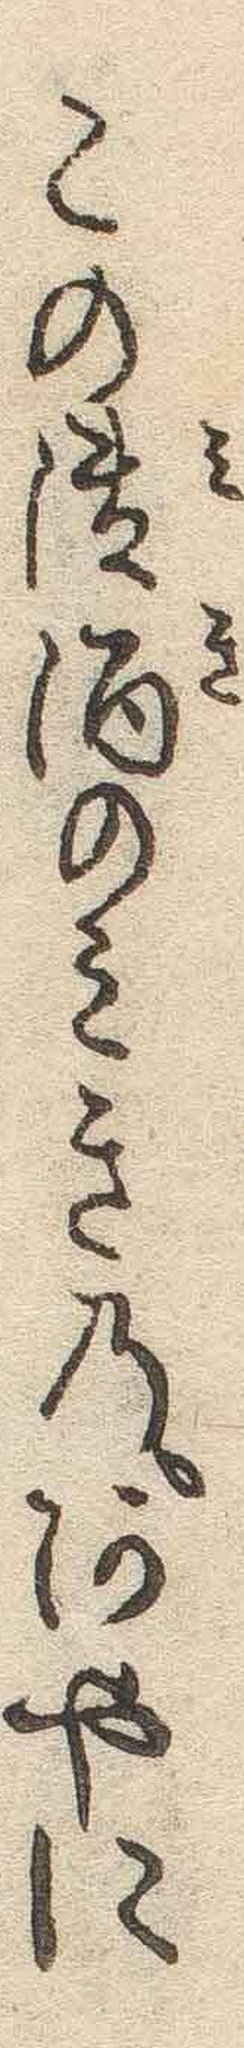この御酒のみきの。あやに
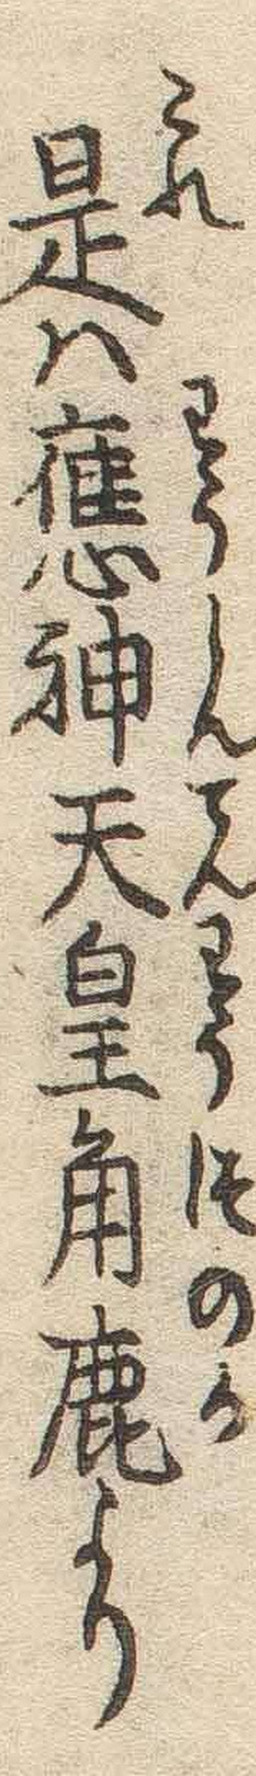是は応神天皇角鹿より
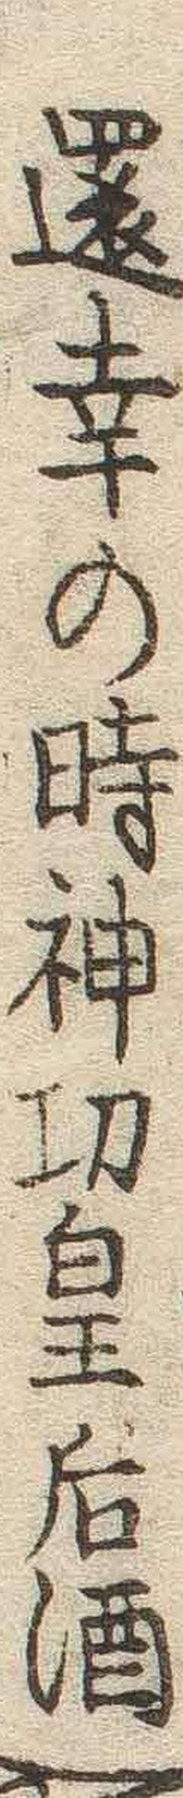還幸の時神功皇后酒
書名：日本山海名産図会
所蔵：東京学芸大学附属図書館 国文学研究資料館
